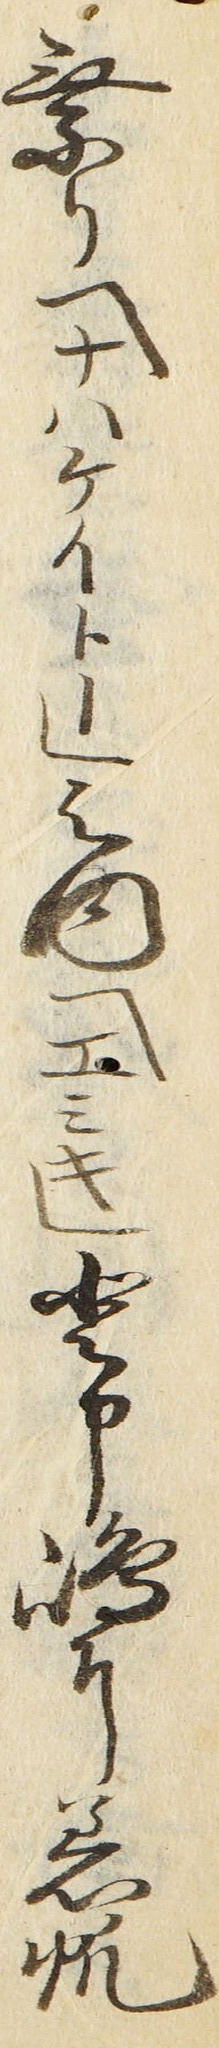乗り「ナハケイトー」之内「エミキ」と申嶋に着帆
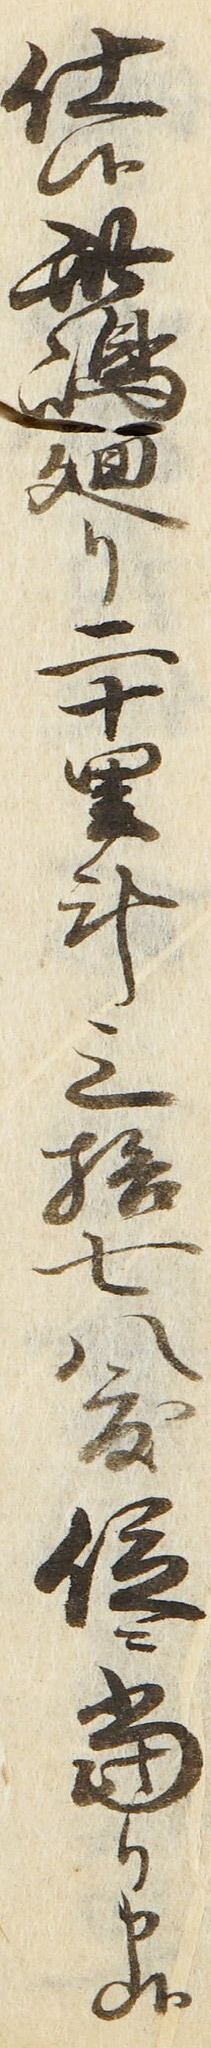仕候此嶋廻り二十里斗三拾七八度位ニ當り申候
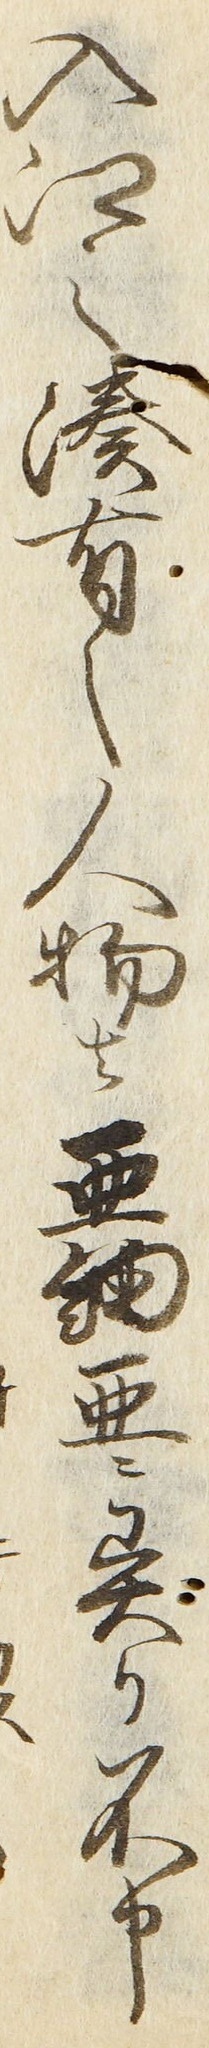入江之湊有之人物者亜細亜ニ異り不申
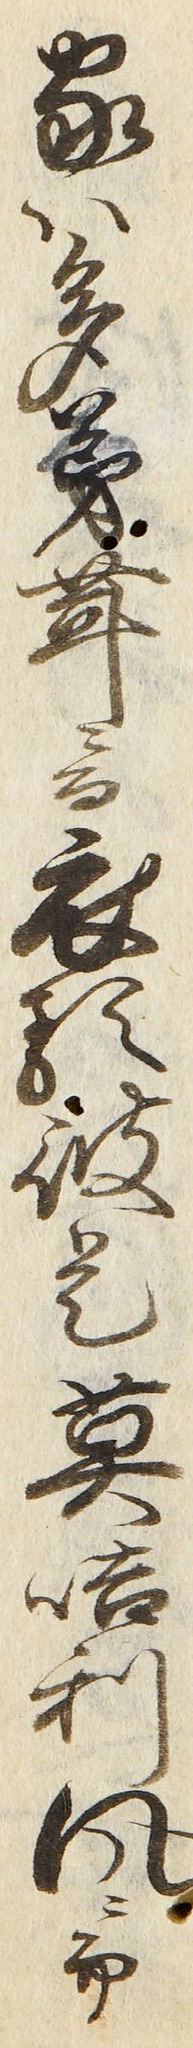家ハ多茅葺ニ而衣類彼是莫咭利風ニ而
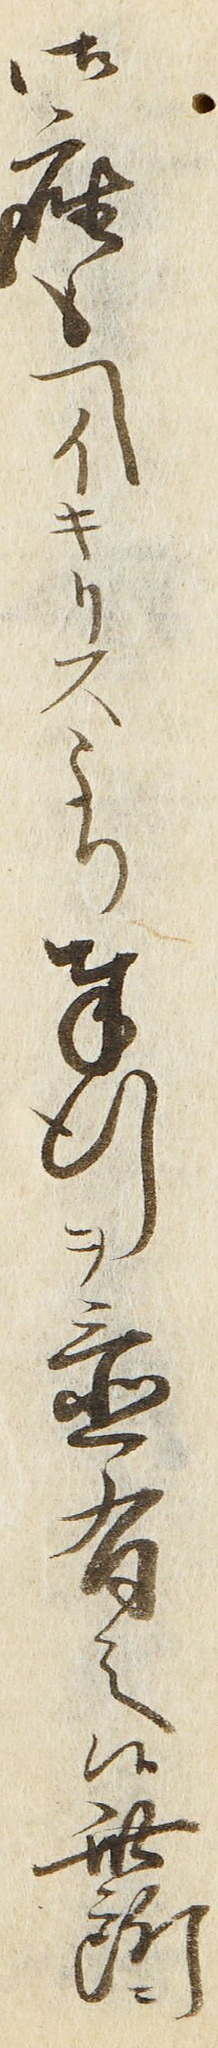御座候「イキリスより奉行ヲ置有之候此所ニ
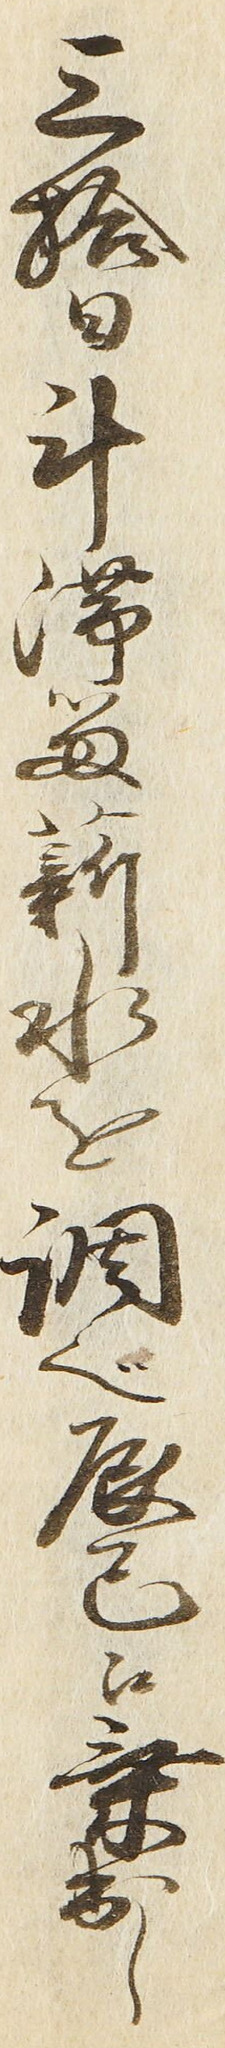三拾日斗滞留薪水を調べ辰巳江乗出し
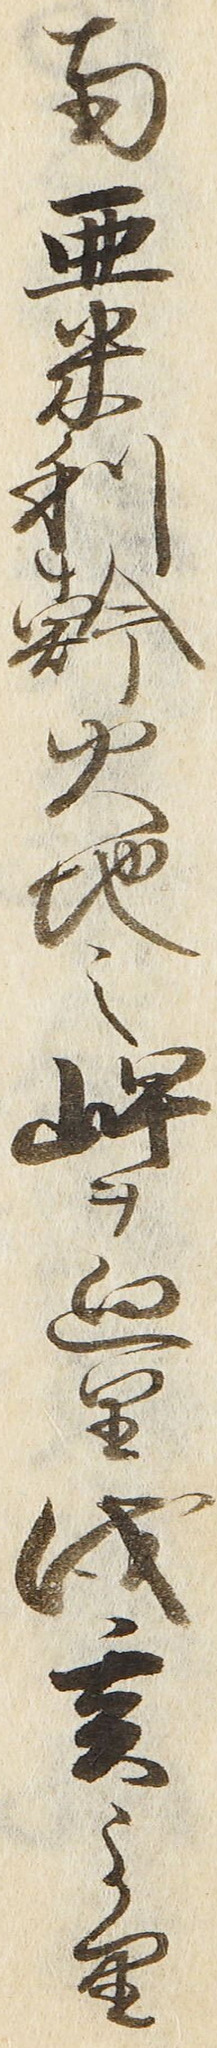南亜米利幹火地之岬ヲ廻り戌亥より
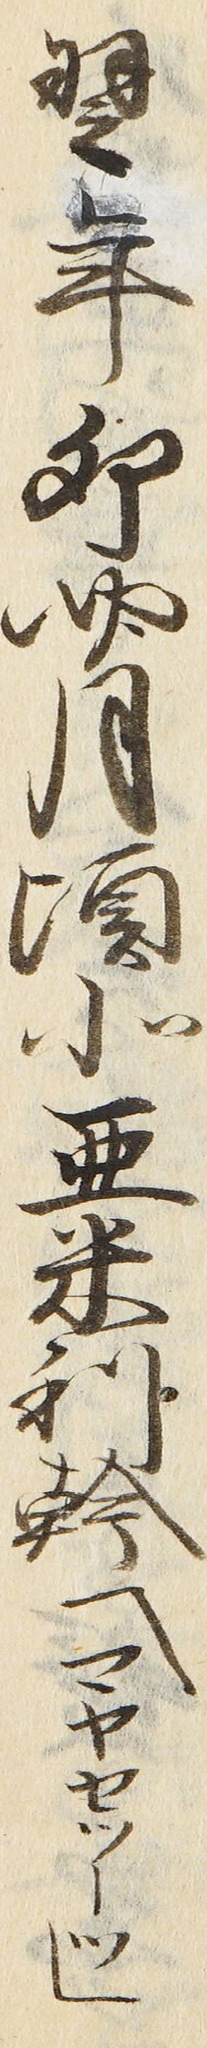翌年卯四月頃北亜米利幹「マヤセツーツ」
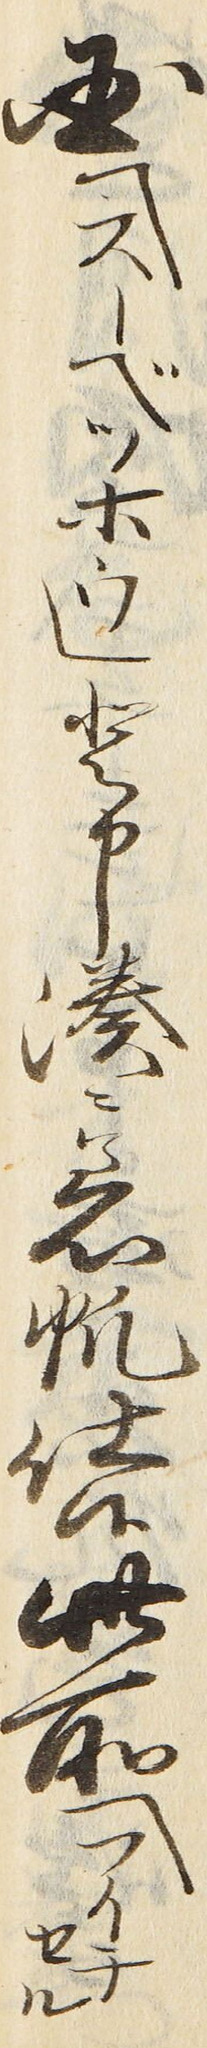国「スーベツホウ」と申湊ニ着帆仕候此所「フイナセル
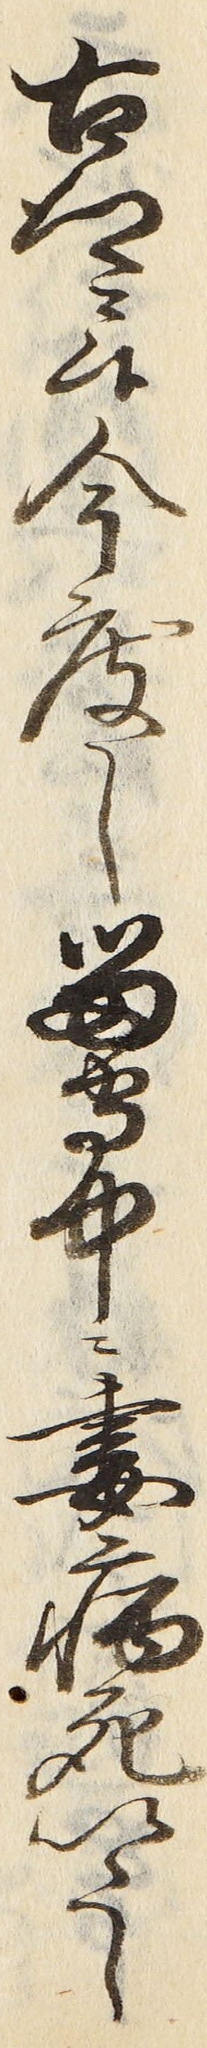古郷ニ候今度之留守中妻病死いたし
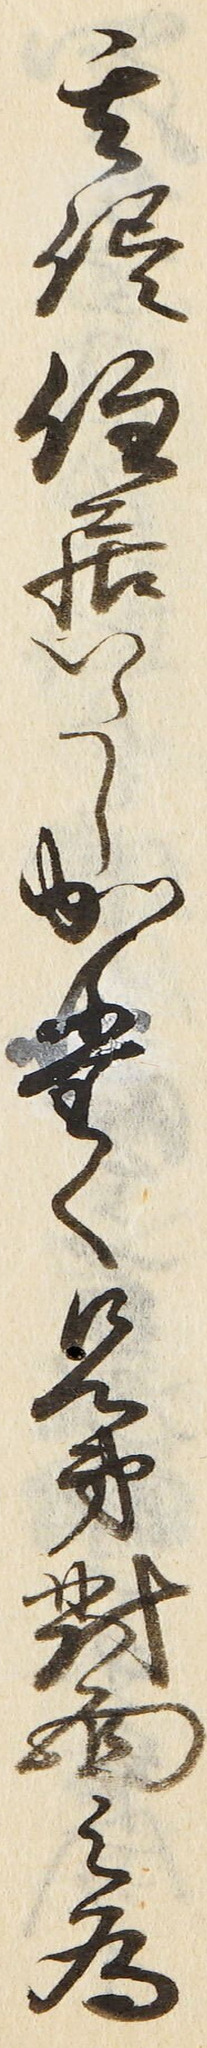其儘住居いたしかたく兄弟對面之為
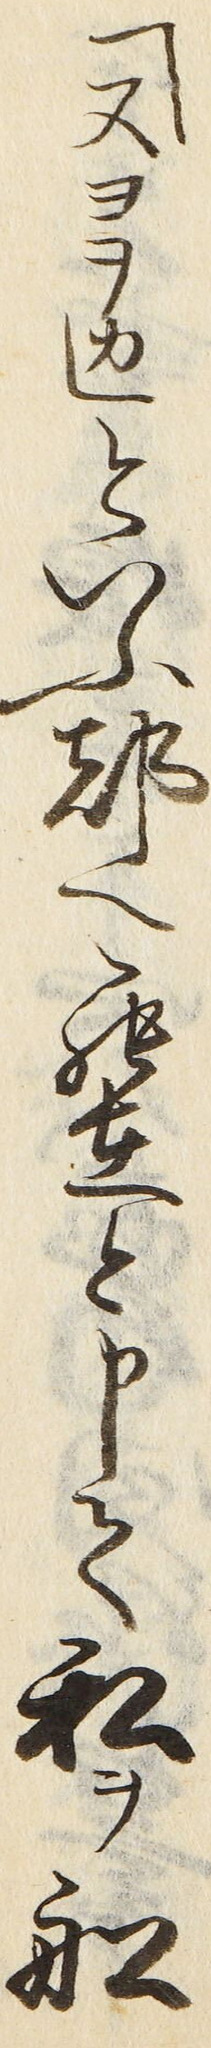「ヌヨヲカ」といふ都へ罷在と申て私ヲ舩
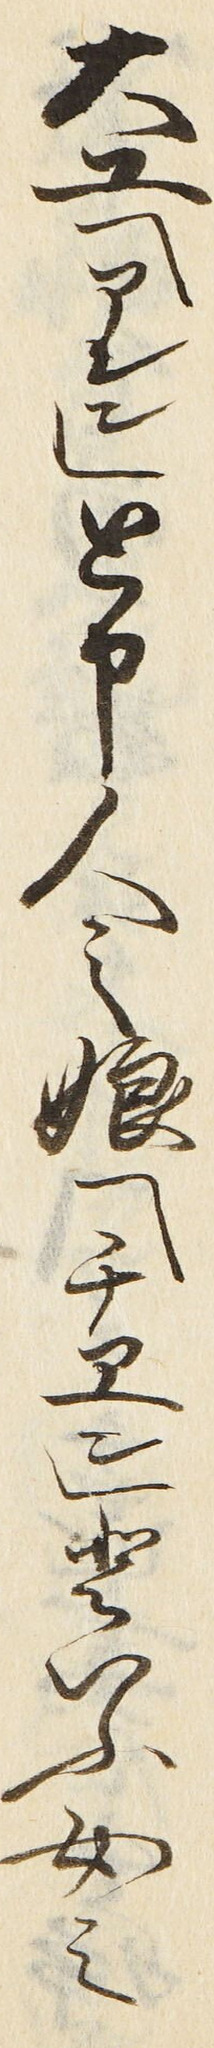大工「アシン」と申人之娘「チエン」といふ女之
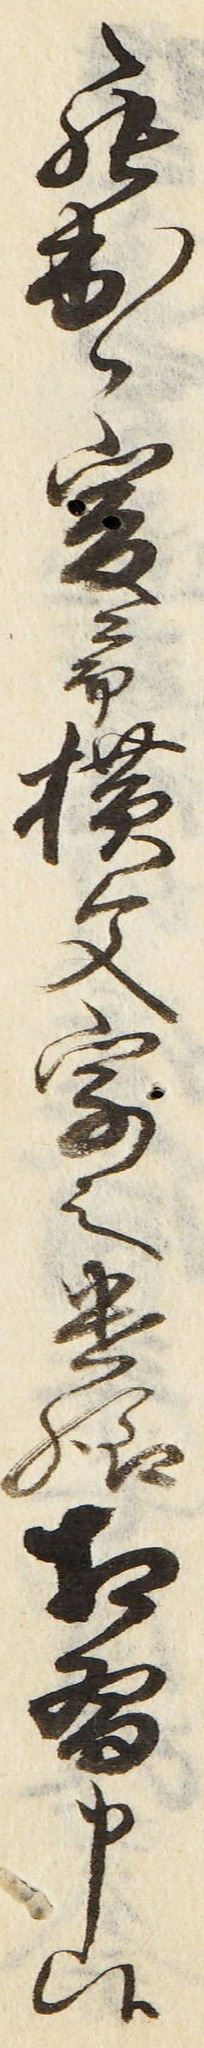罷出候爰ニ而横文字之遣様相習申候
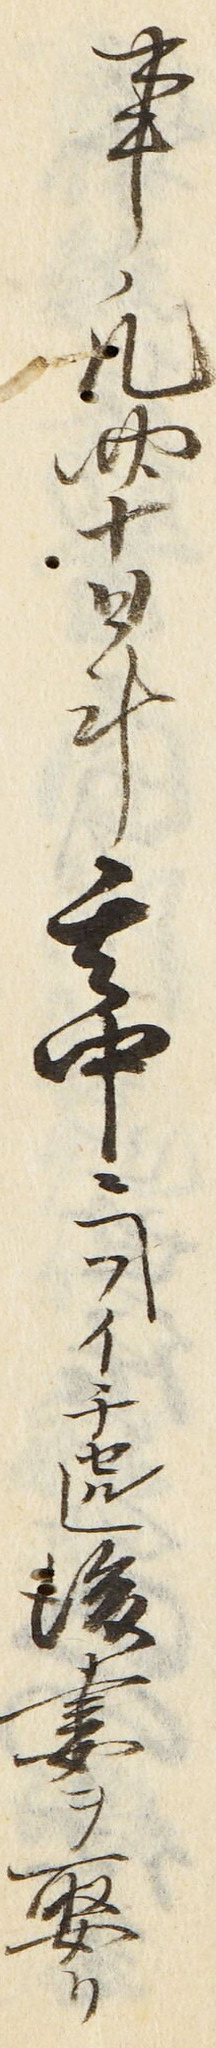事凡四十日斗其中ニ「フイチセル」後妻ヲ娶り
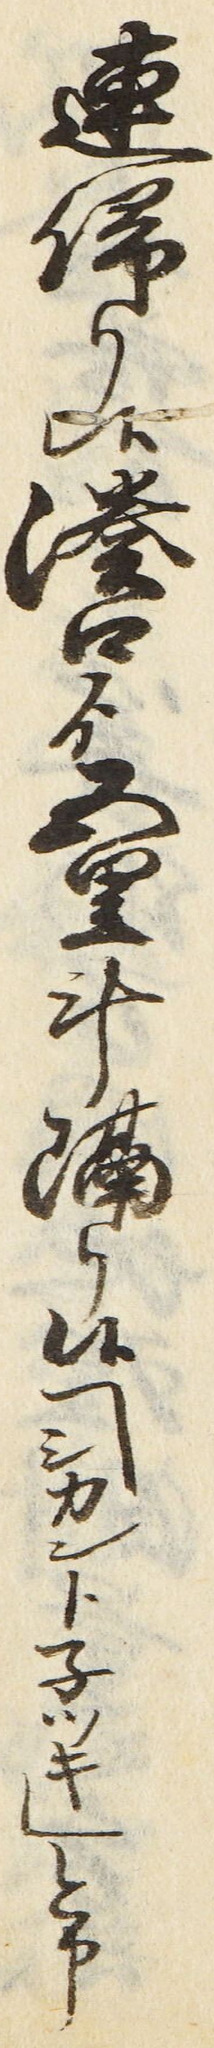連帰り候湊口ゟ五里斗隔り候「シカント子ツキ」と申
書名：漂客談寄
